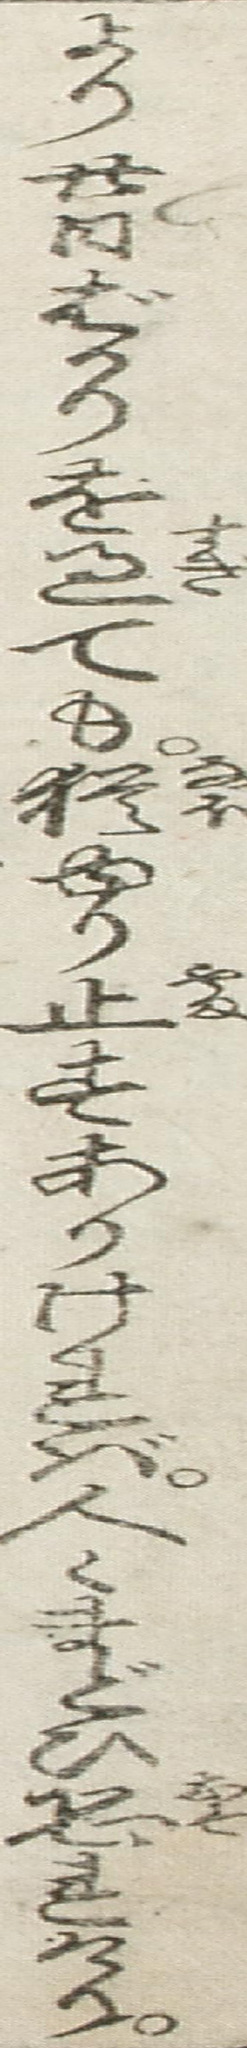より廿日ばかりを過ても。猶ゆり止すありければ。人〻まどひ恐れけり。
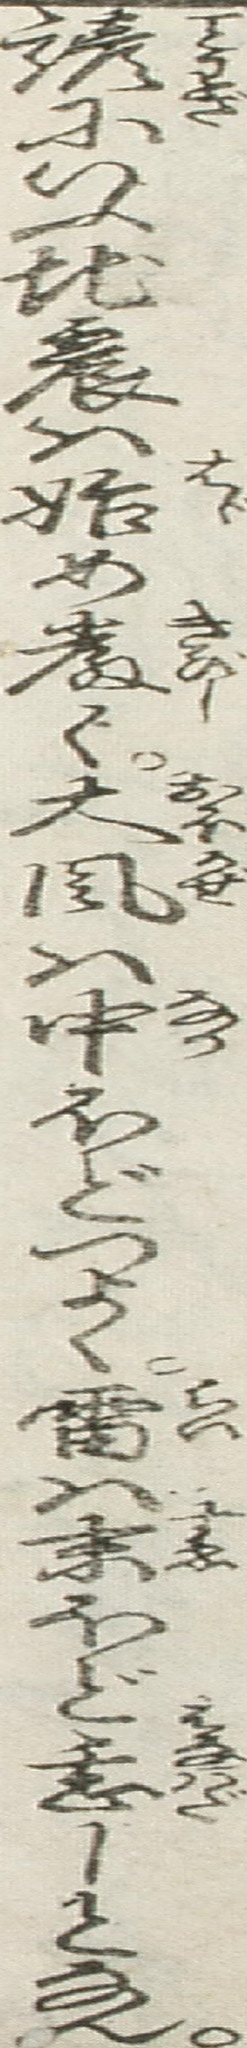諺にいふ地震は始め厳く。大風は中ほどつよく。雷は末ほど甚しとなん。
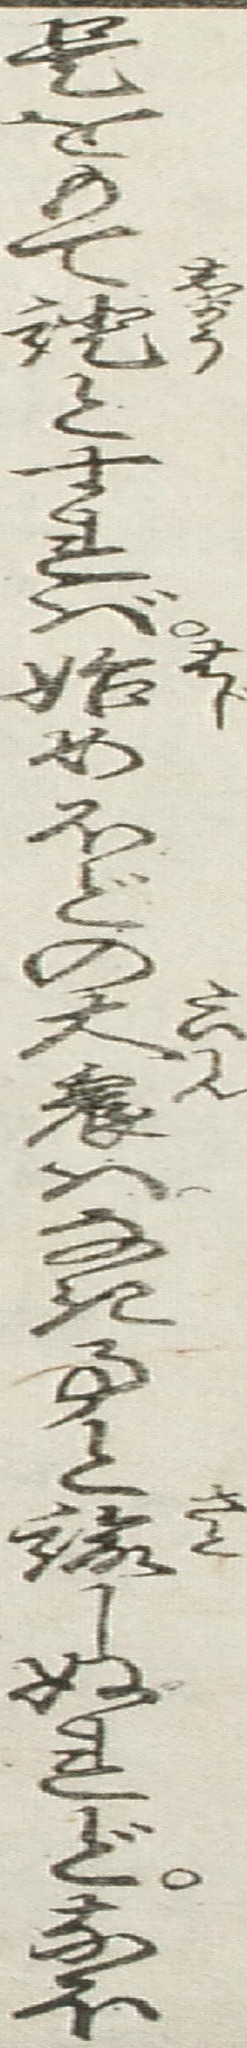是をもて證とすれば。始めほどの大震はなき事と諭しぬれど。なほ
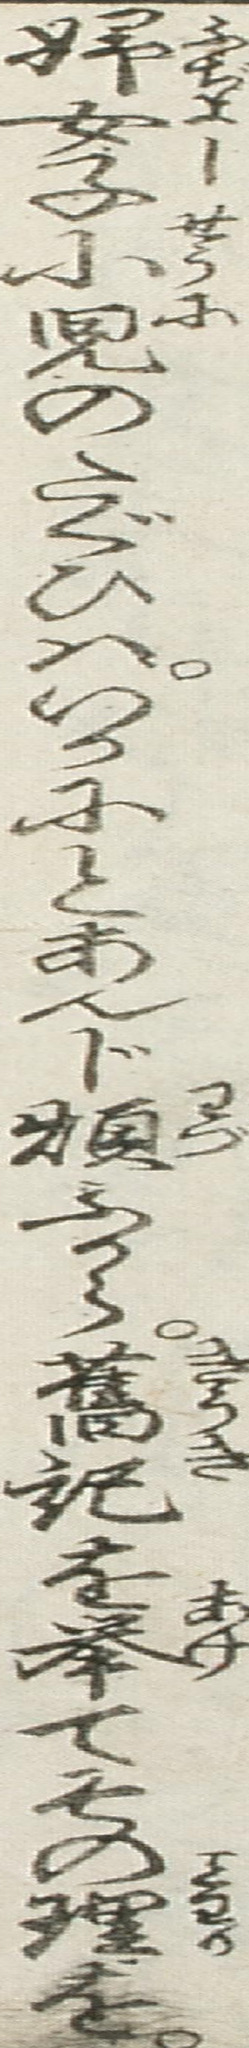婦女子小児のたぐひは。いかにとあんじ煩ふから。舊記を挙てその理を。
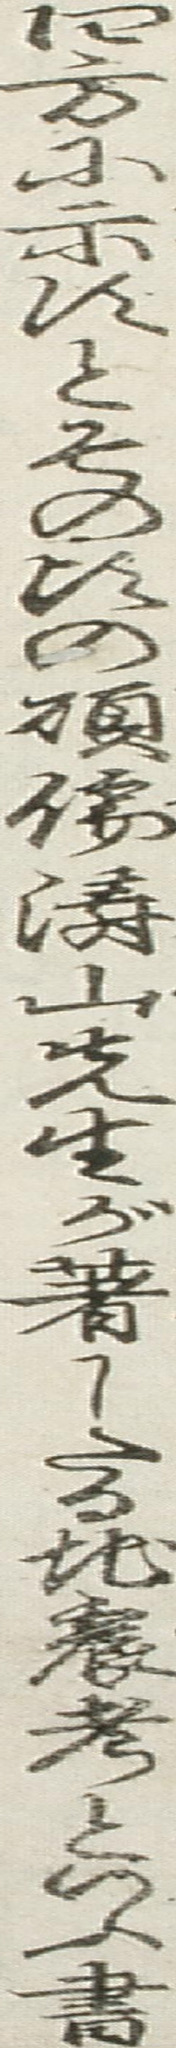四方に示すとその頃の碩儒。涛山先生が著したる地震考といふ書
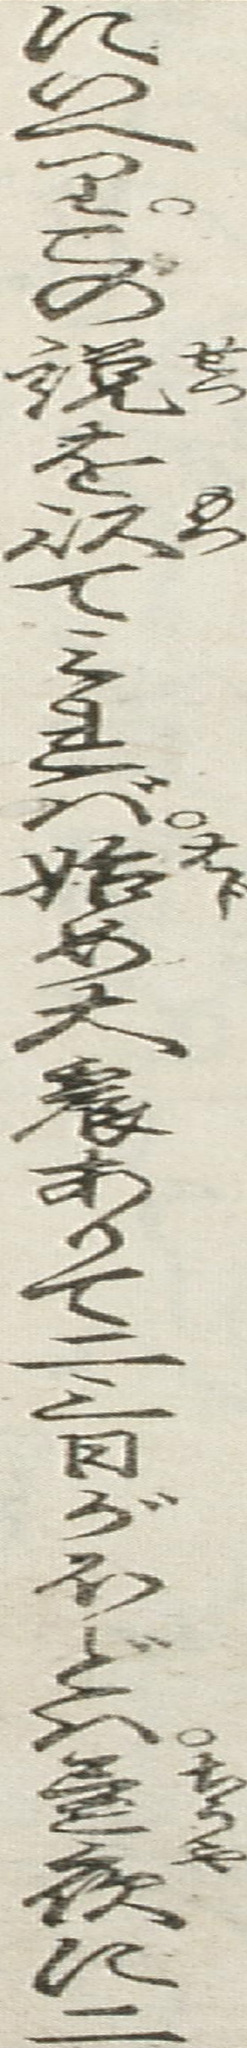にいへり。この説を以てみれば。始め大震ありて二三日がほどは。昼夜に二
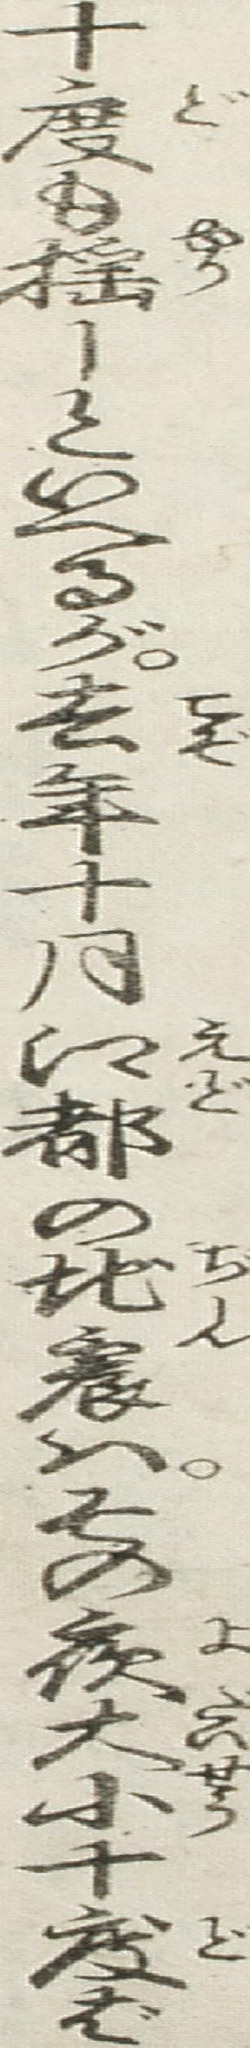十度も揺しといへるが。去年十月江都の地震は。その夜大小十度ば
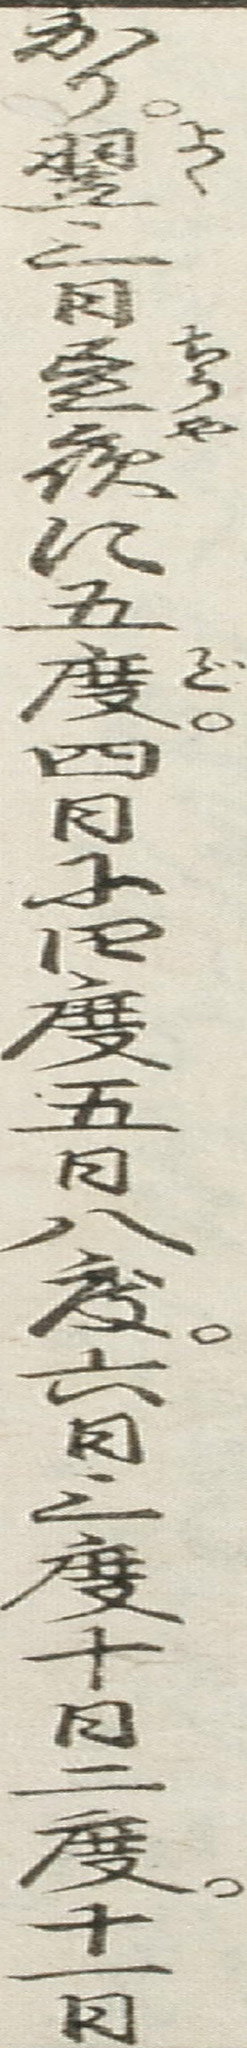かり。翌三日昼夜に五度。四日に四度五日八度。六日三度十日二度。十一日
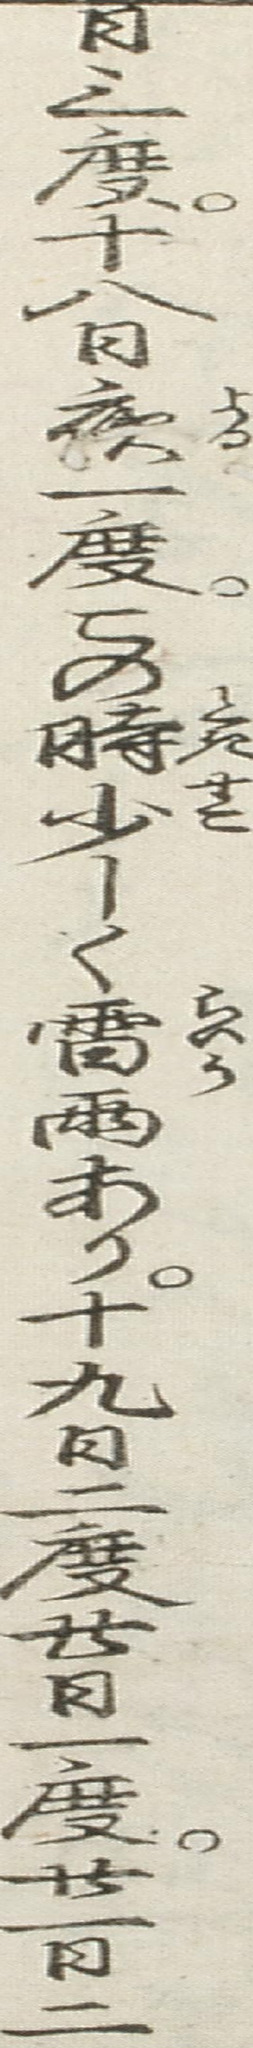日三度。十八日夜一度。この時少しく雷雨あり。十九日二度廿日一度。廿一日二
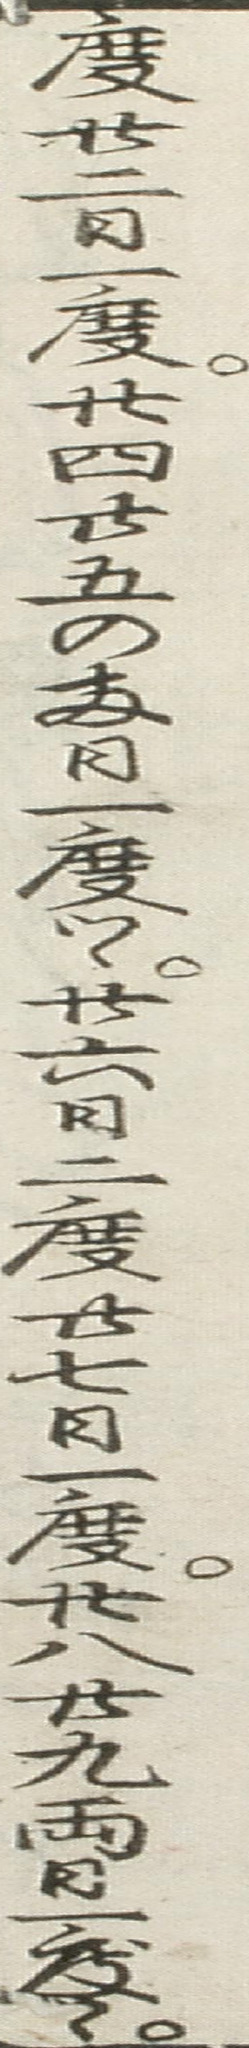度廿ニ日一度。廿四廿五の両日一度ツヽ。廿六日二度廿七日一度。廿八廿九両日一度ツヽ。
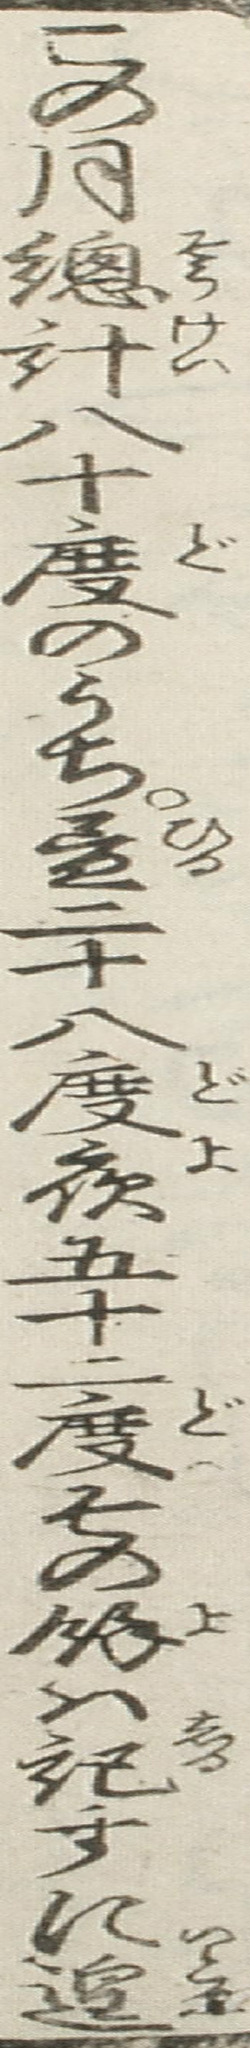この月総計八十度のうち。昼二十八度夜五十二度その余は記すに遑
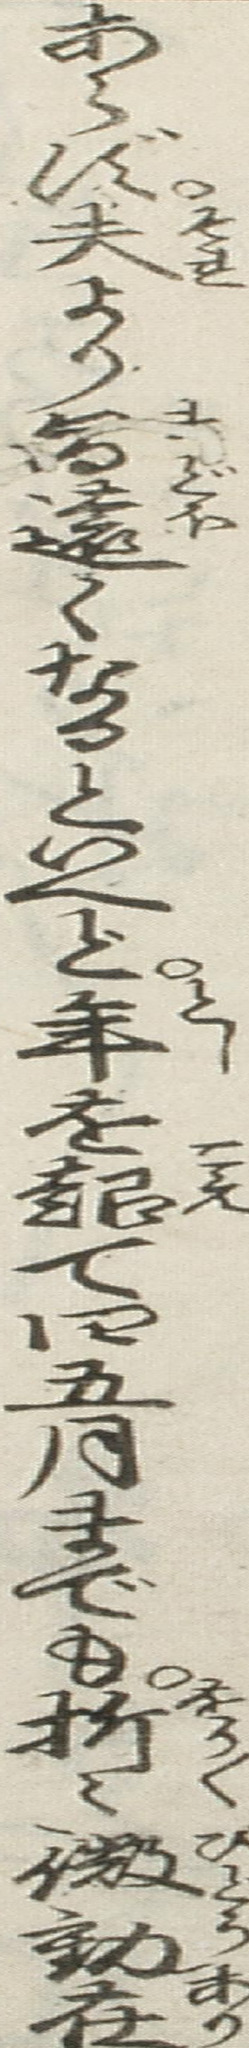あらず。夫より間遠くなるといへど。年を超て四五月までも。折〻微動在
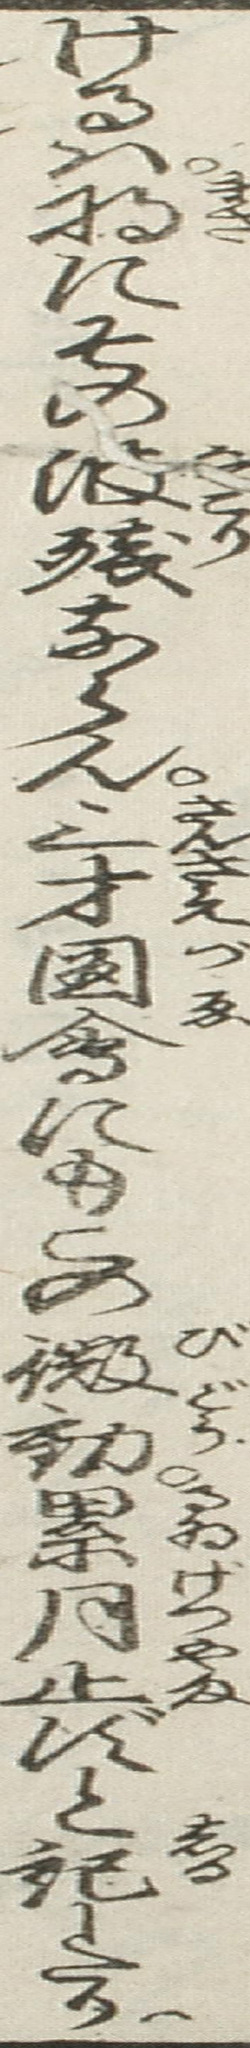けるは。将にその波残ならん。三才図会にもこの微動。累月止ずと記したり。
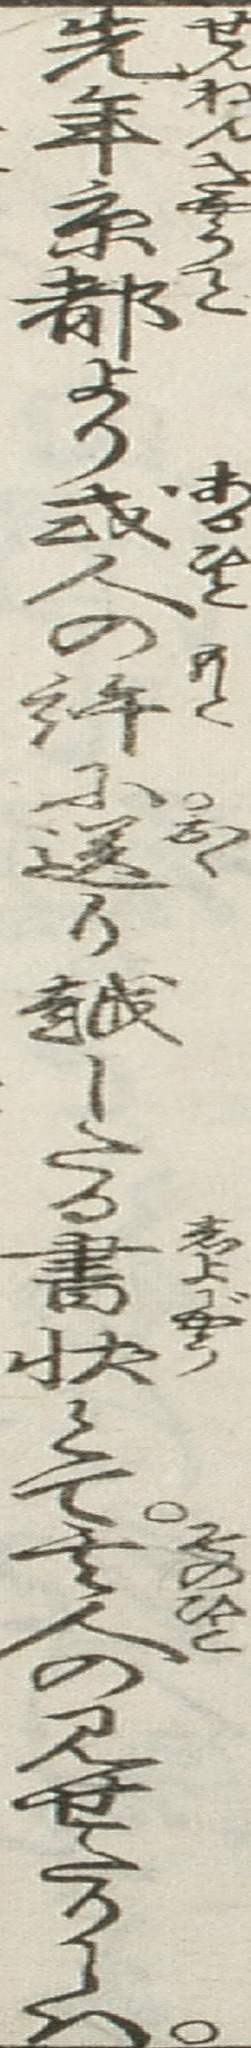先年京都より或人の許に送り越したる書状とて。其人の見せたりしは。
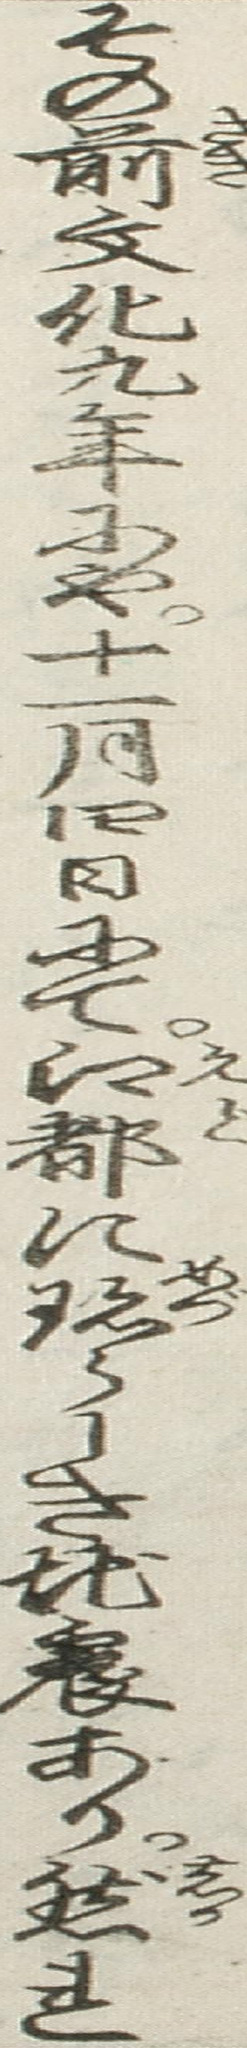その前文化九年にや。十一月四日にて。江都に珍らしき地震あり。然れ
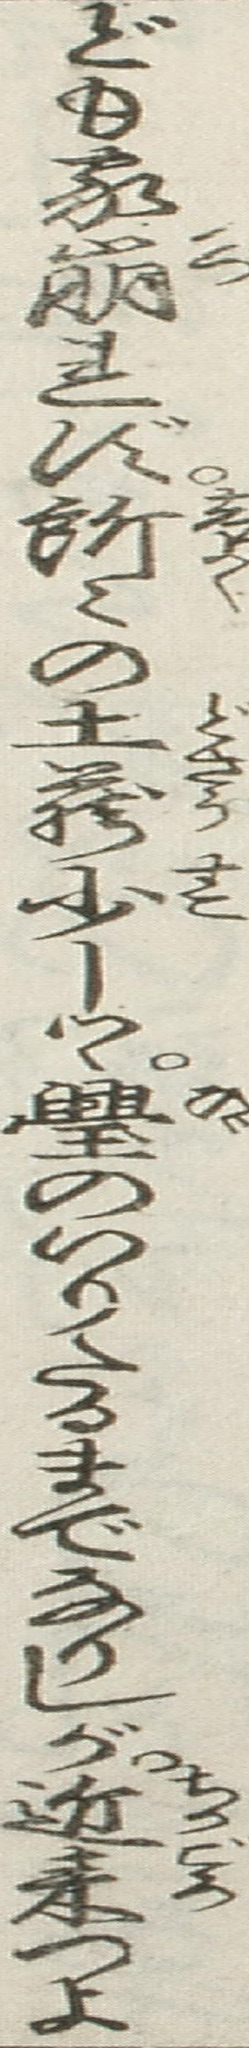ども家崩れず。所〻の土蔵少しツヽ。璺のいりたるまでなりしが。近来つよ
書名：安政見聞録　下
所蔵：東京大学地震研究所図書室 Earthquake Research Institute Library, The University of Tokyo, JAPAN
